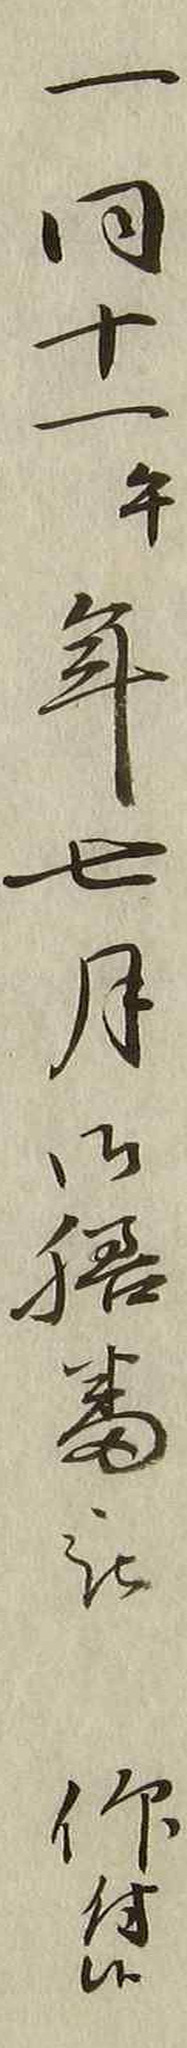一同十一午年七月御膳番被仰付候
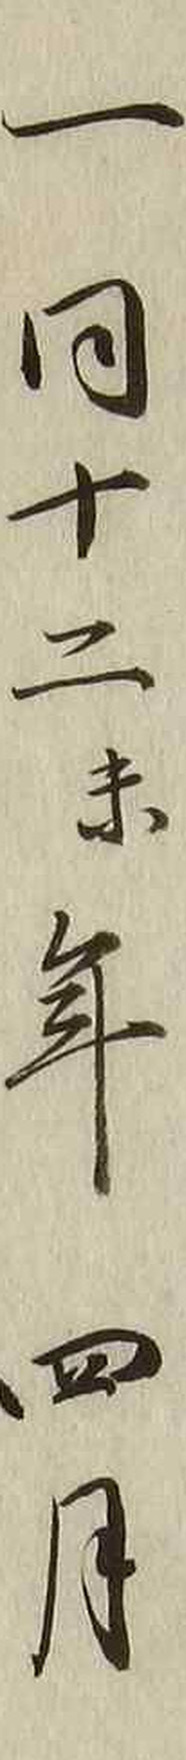一同十二未年四月
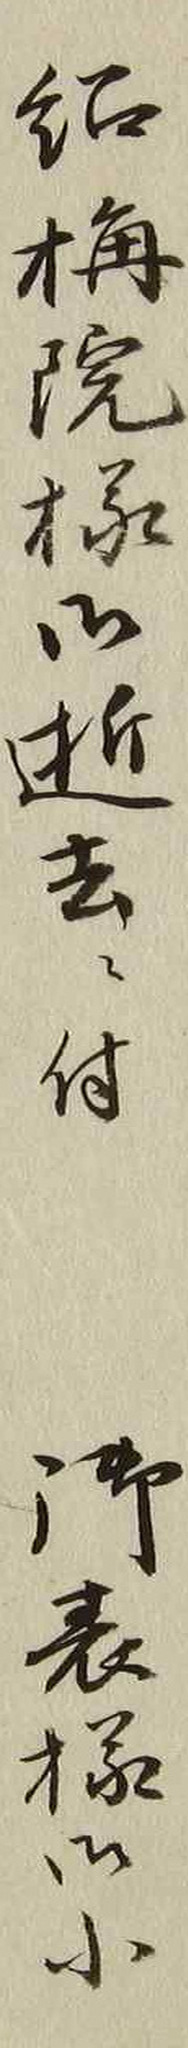紹栴院様御逝去ニ付御表様御小
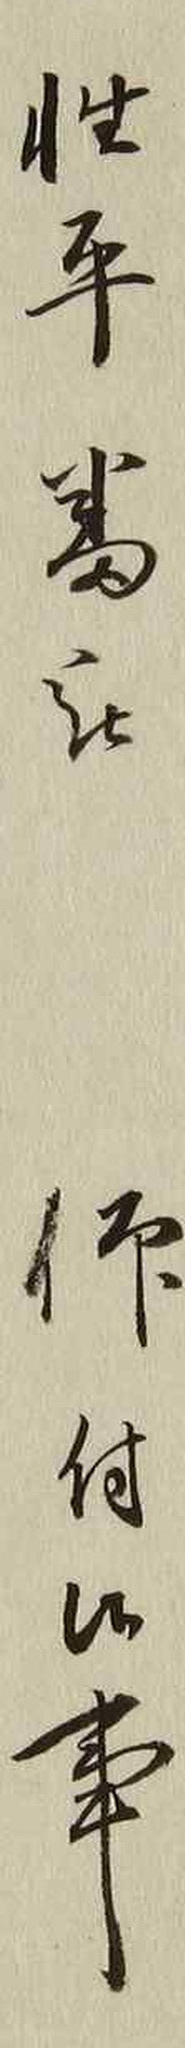性平番被仰付候事
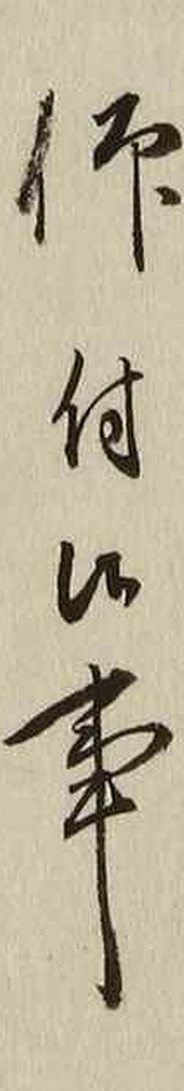仰付候事
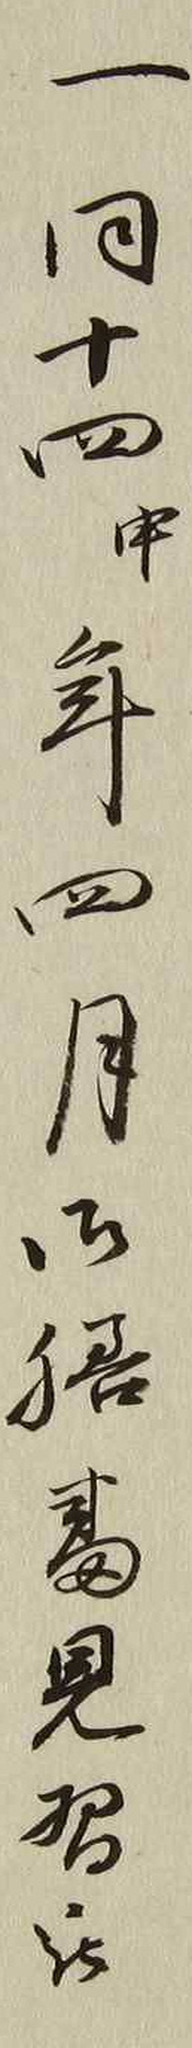一同十四申年四月御膳番見習被
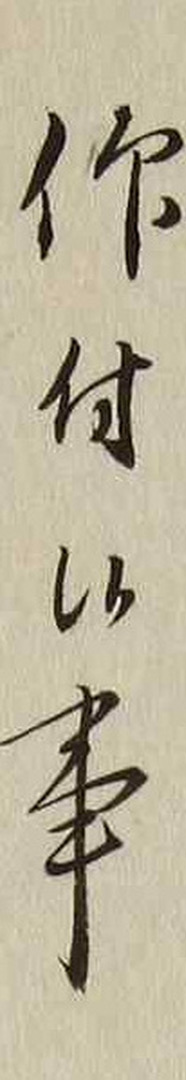仰付候事
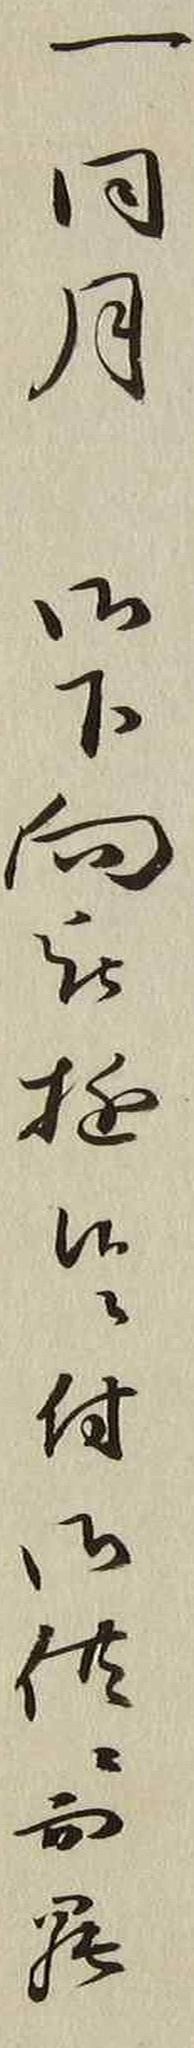一同月御下向被遊候ニ付御供ニ而罷
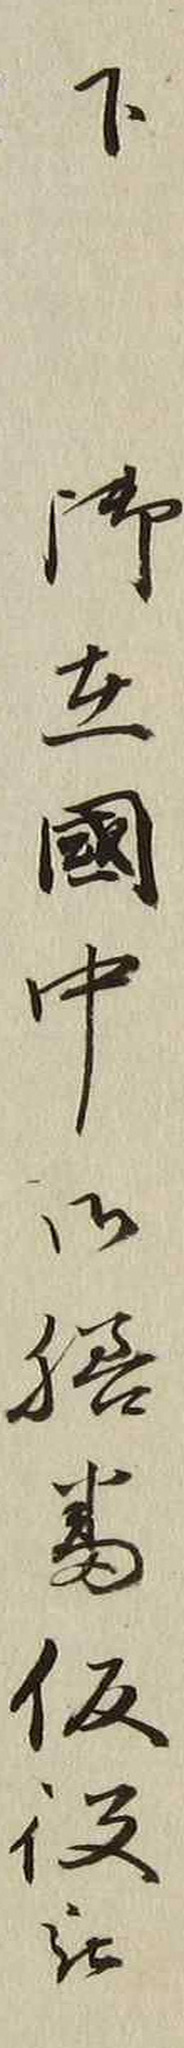下御在国中御膳番仮役被
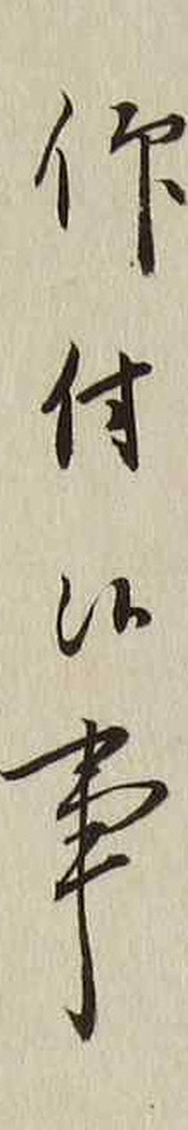仰付候事
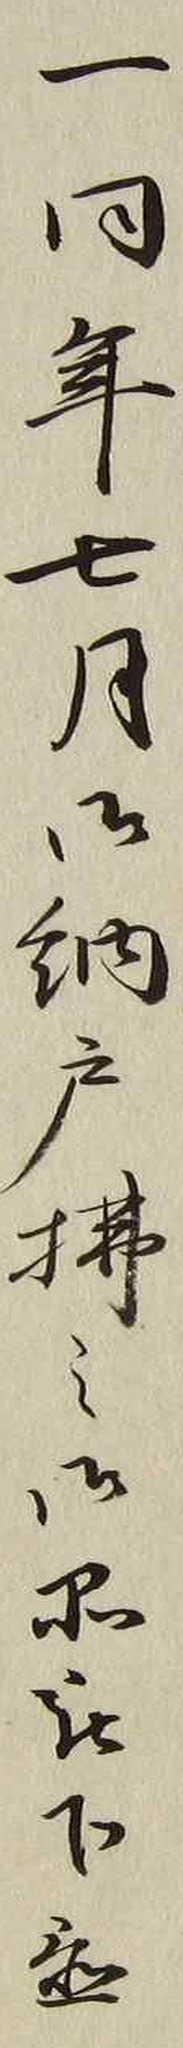一同年七月御納戸拂之御品被下置
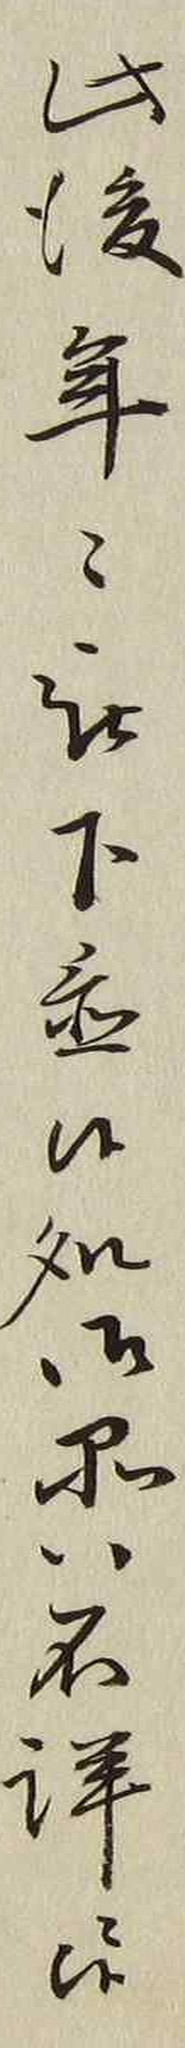此後年々被下置候処御品ハ不詳ニ候
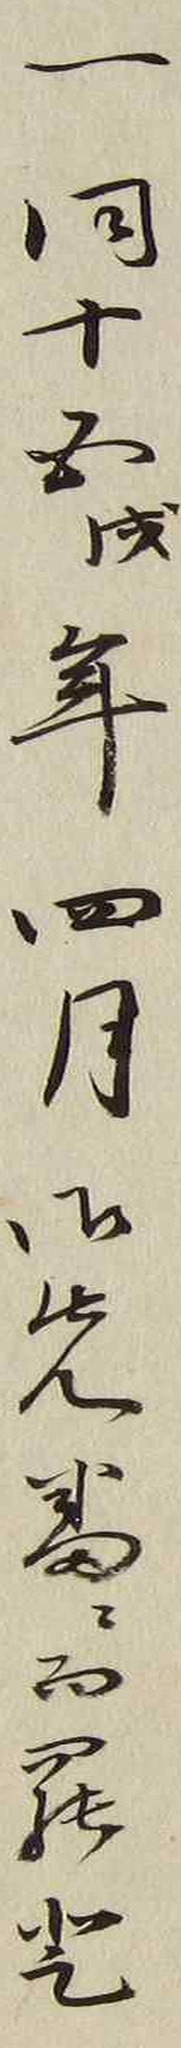一同十五戌年四月御先番ニ而罷登
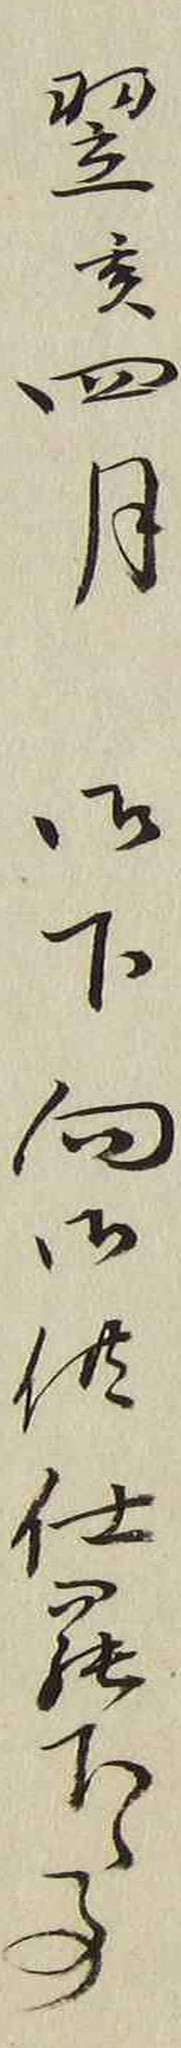翌亥四月御下向御供仕罷下候事

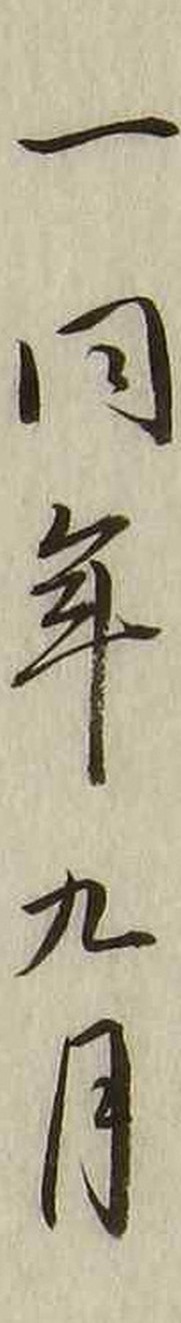一同年九月
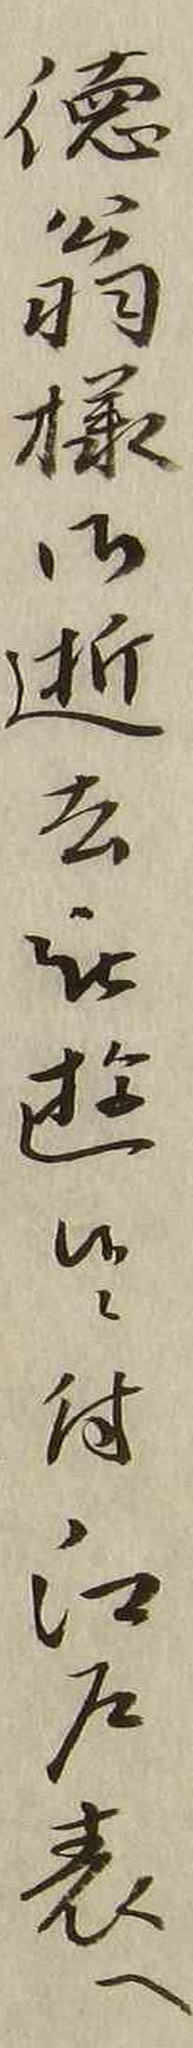徳翁様御逝去被遊候ニ付江戸表へ
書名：諸士系譜　巻之19　い之部19
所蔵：会津若松市立会津図書館
